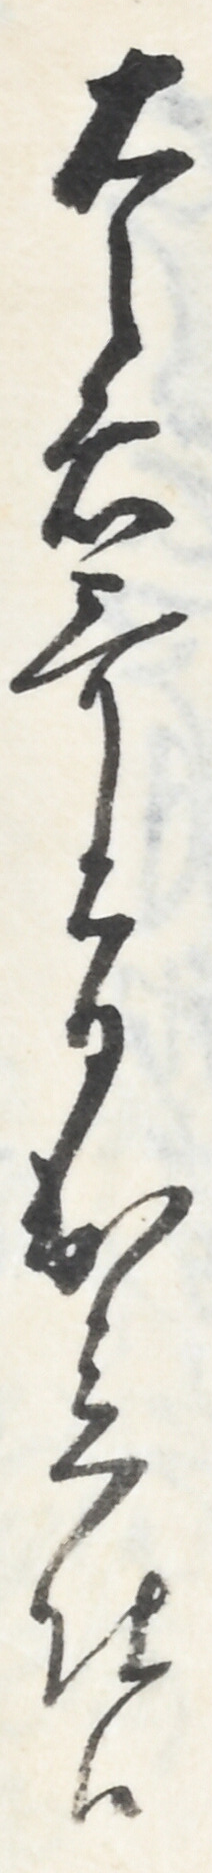右之者同廿二日出立仕候
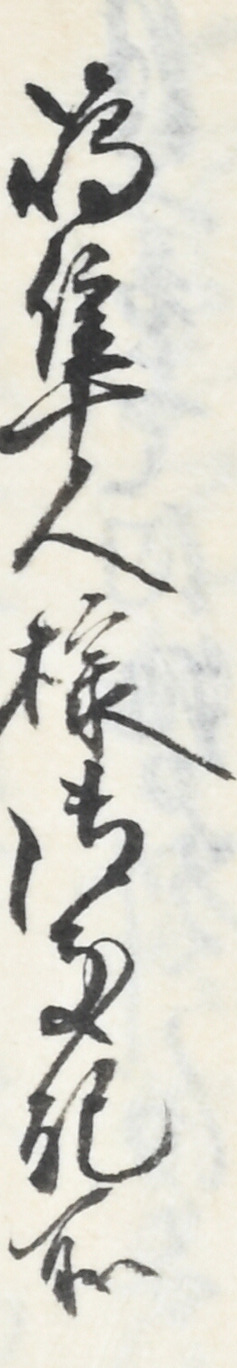嶋隼人様御支配所

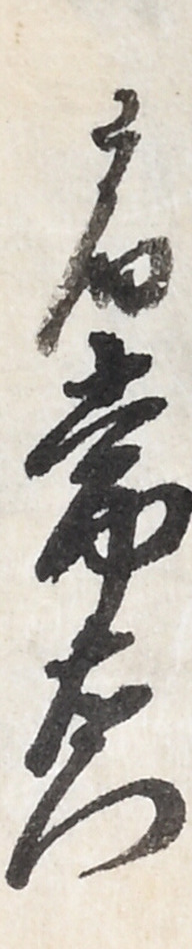宿金右衛門
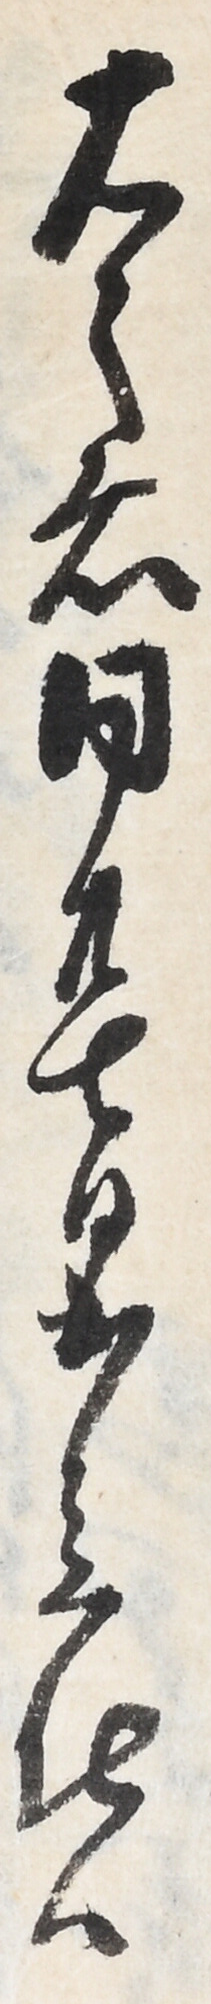右之者同廿二日出立仕候
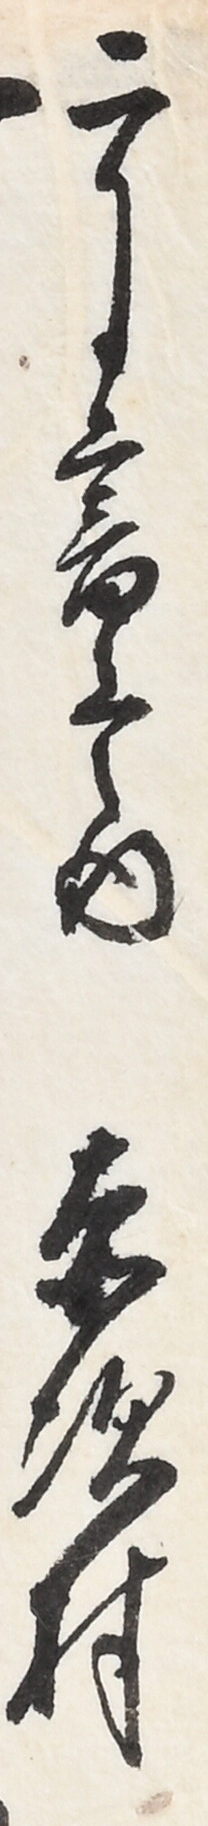二月書上之内赤次村
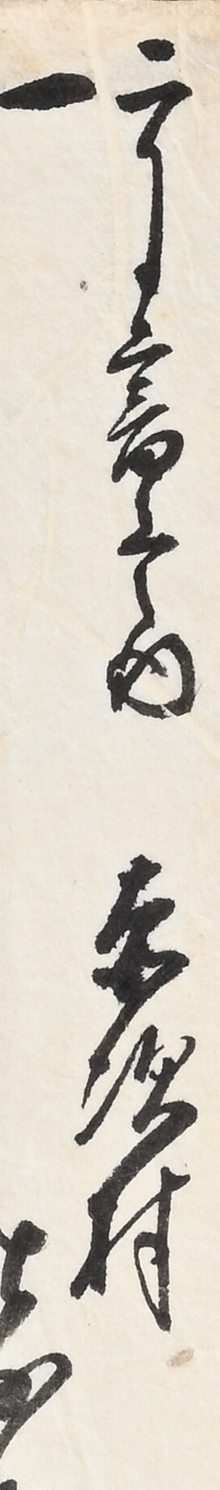二月書上之内赤次村
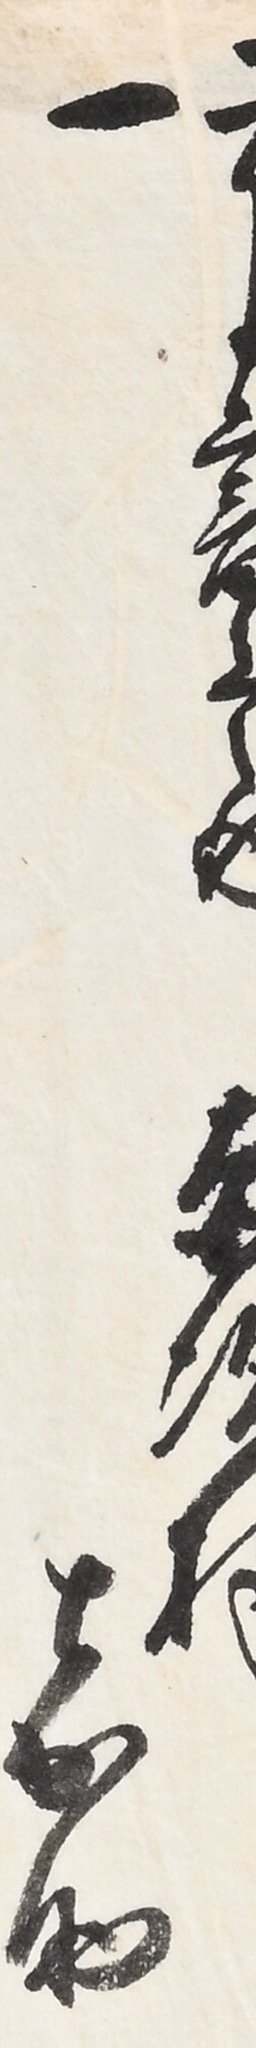一嘉助
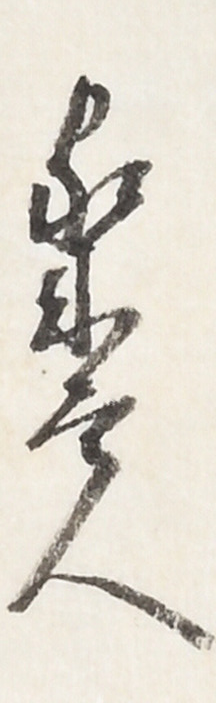家来壱人
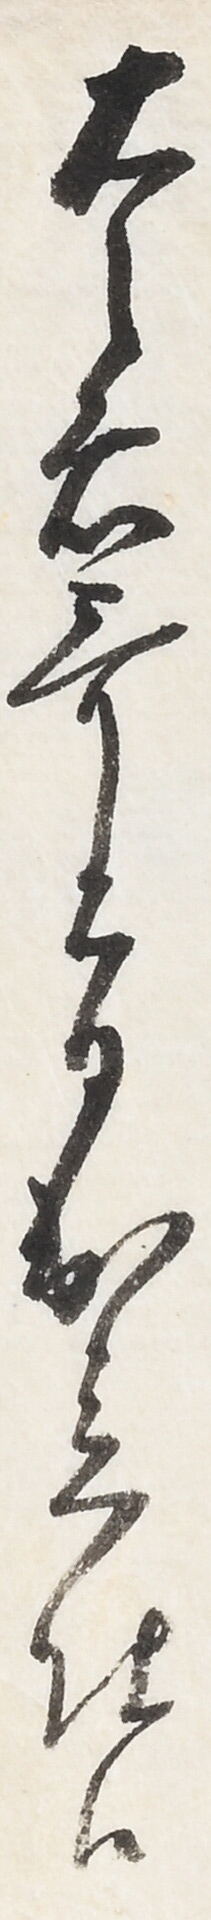右之者三月六日出立仕候
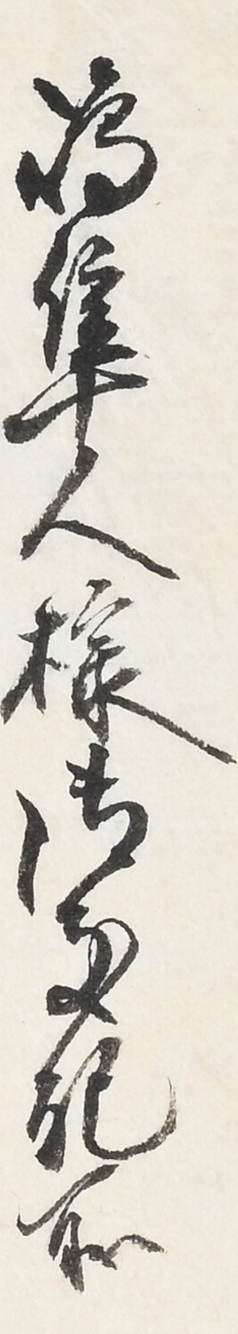嶋隼人様御支配所
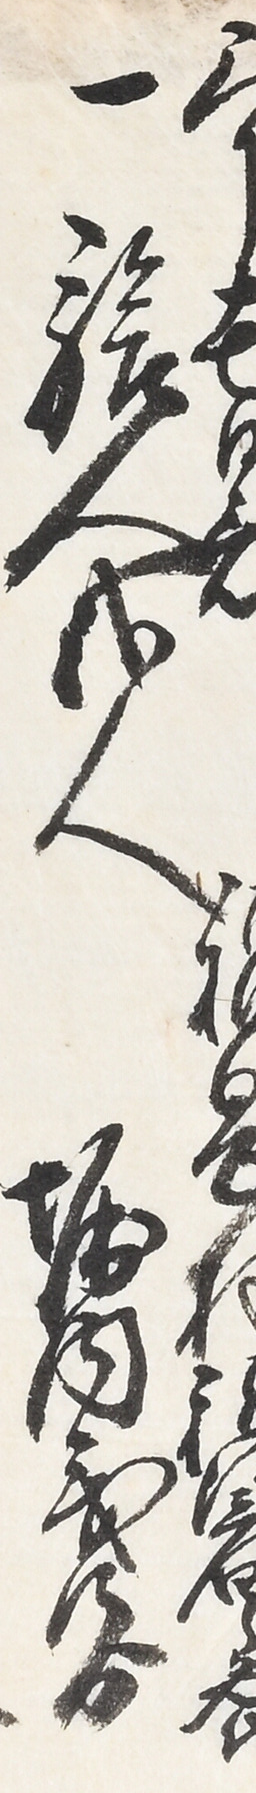一旅人弐人堀内義次郎
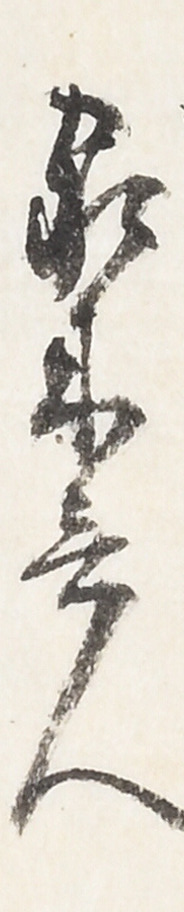家来壱人
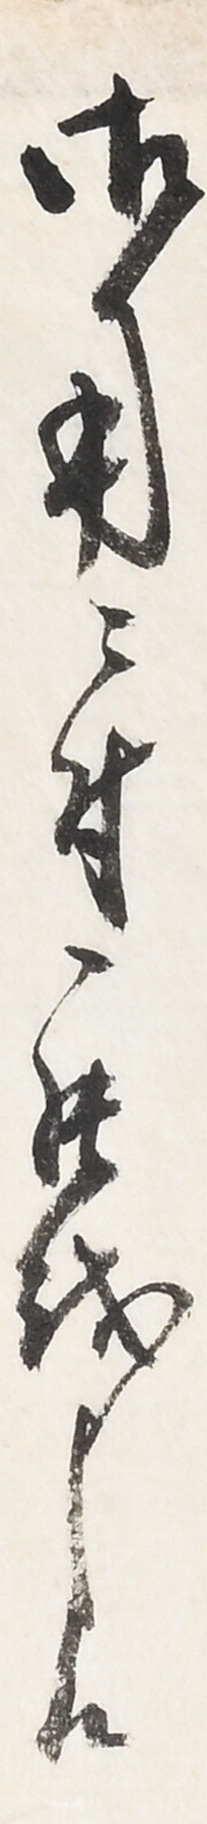御用ニ付罷越申候
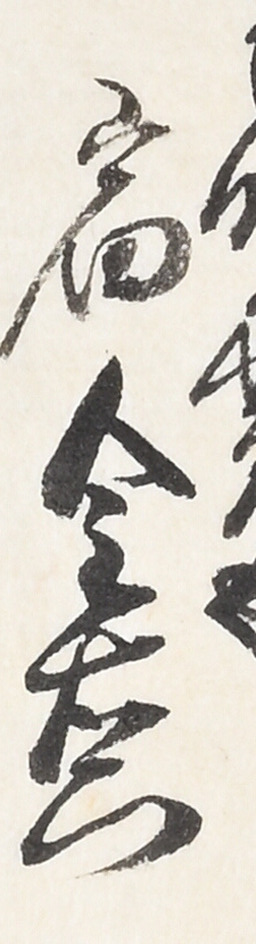宿金右衛門
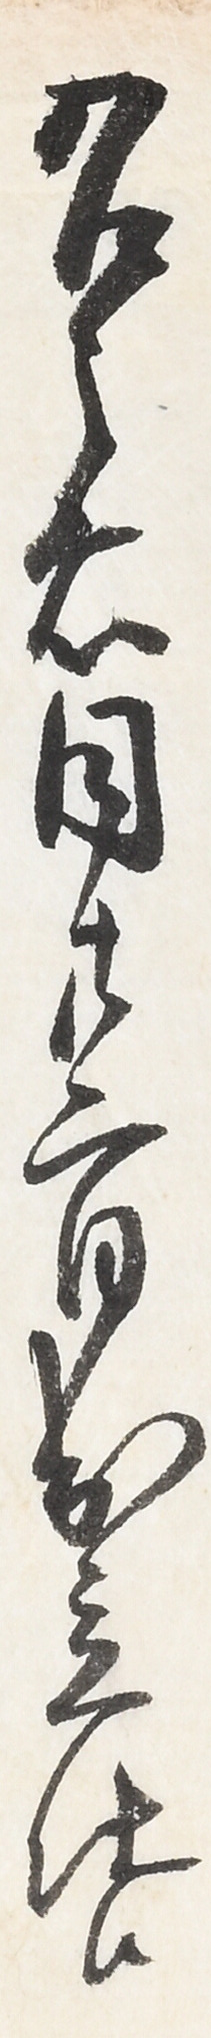右之者同廿二日出立仕候
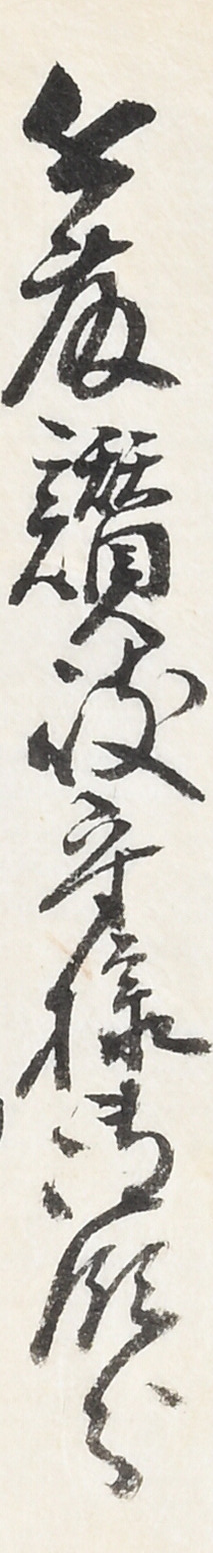近藤讃岐守様御領分
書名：旅人泊控帳
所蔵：伊那市立高遠町図書館・合同会社AMANE
